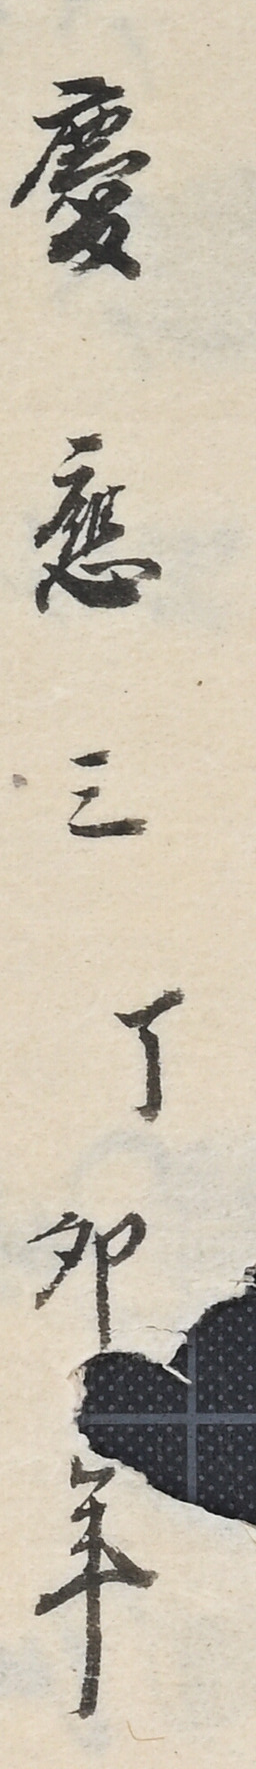慶應三丁卯年
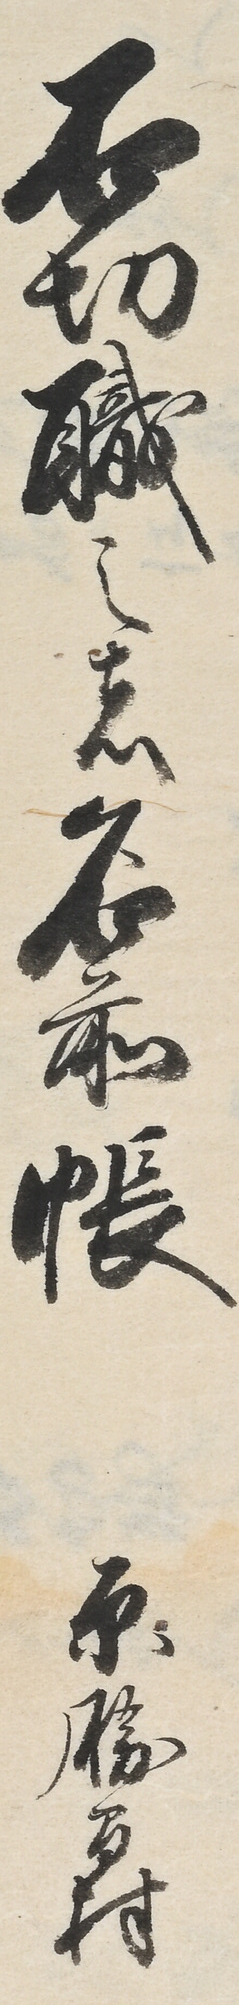石切職之者名前帳原勝間村

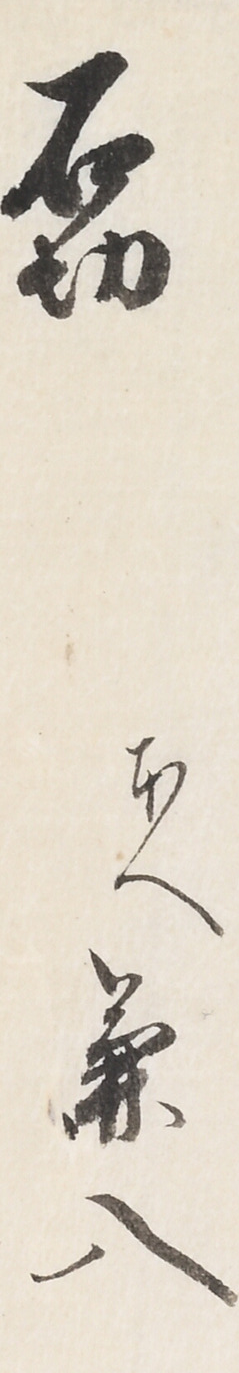石切本人兼八
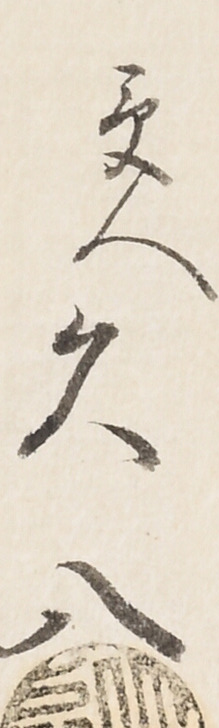受人久八㊞
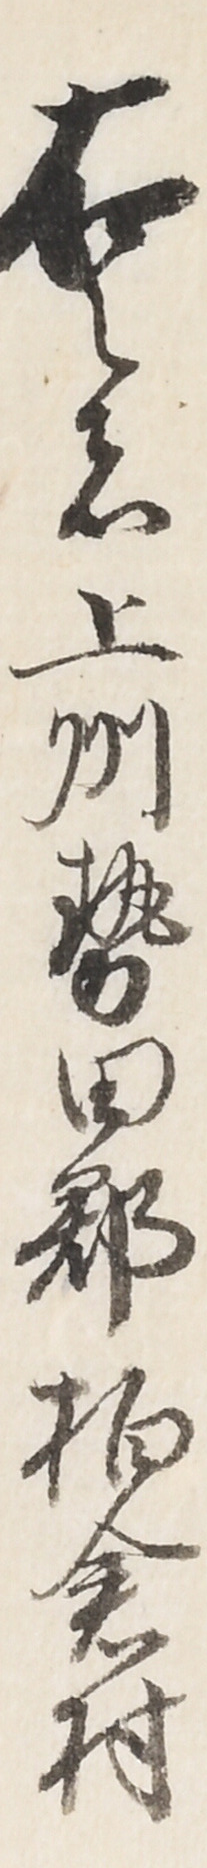右之者上州勢田郡柏蔵村
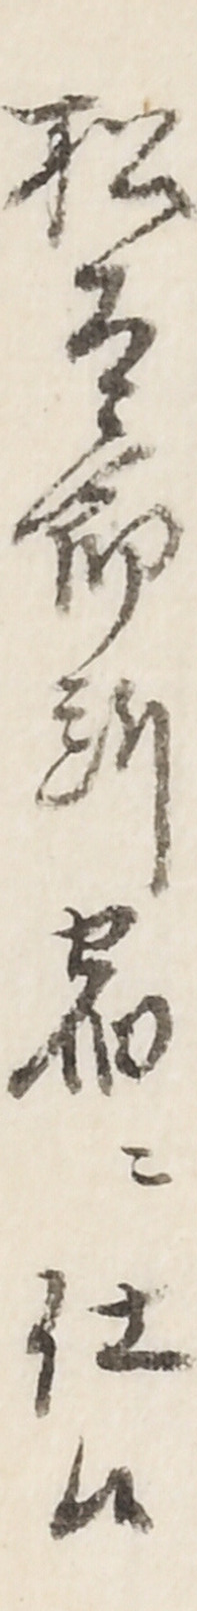松太郎所宿ニ仕候
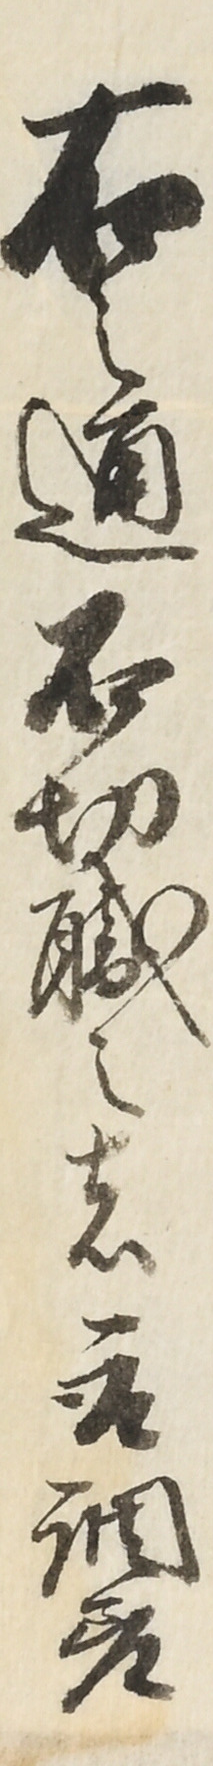右之通石切職之者取調差
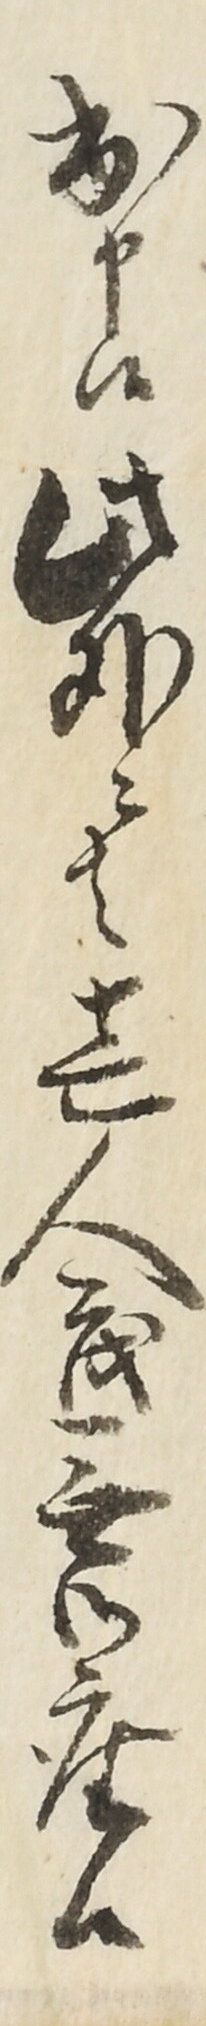出申候此外ニ者壱人茂無御座候

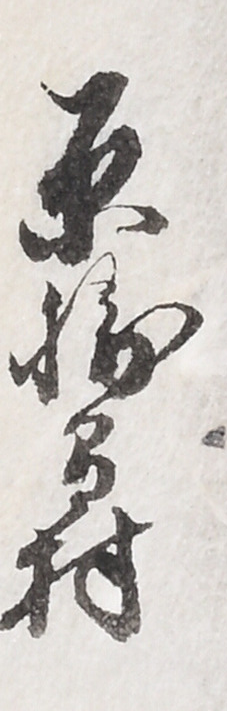原勝間村
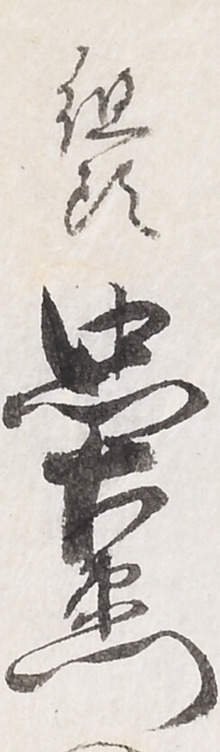組頭忠右衛門㊞
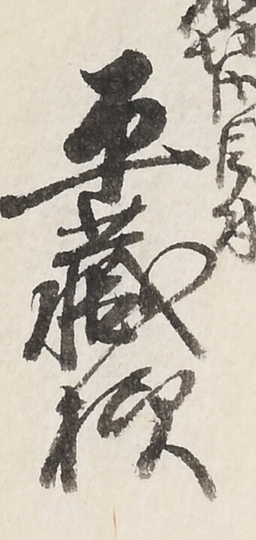平蔵様
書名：慶應三丁卯年月石切職之者名前帳
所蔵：伊那市立高遠町図書館・合同会社AMANE
